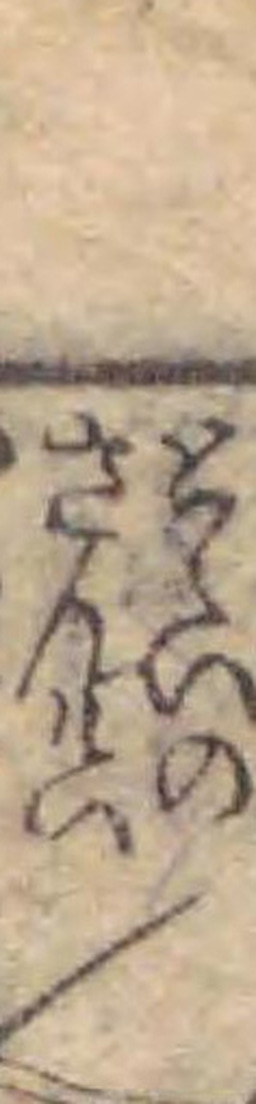さんけい
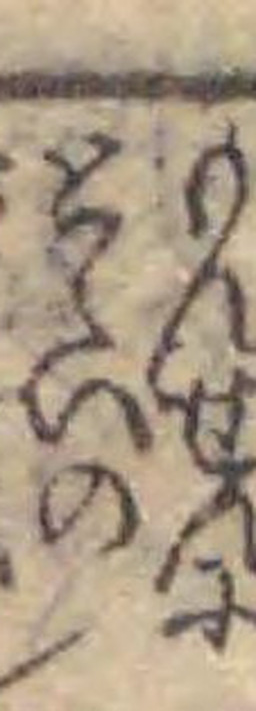とくいの
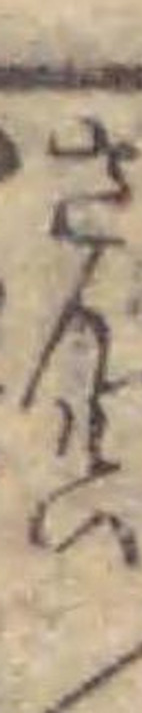さんけい
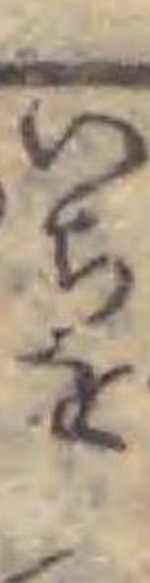いちを
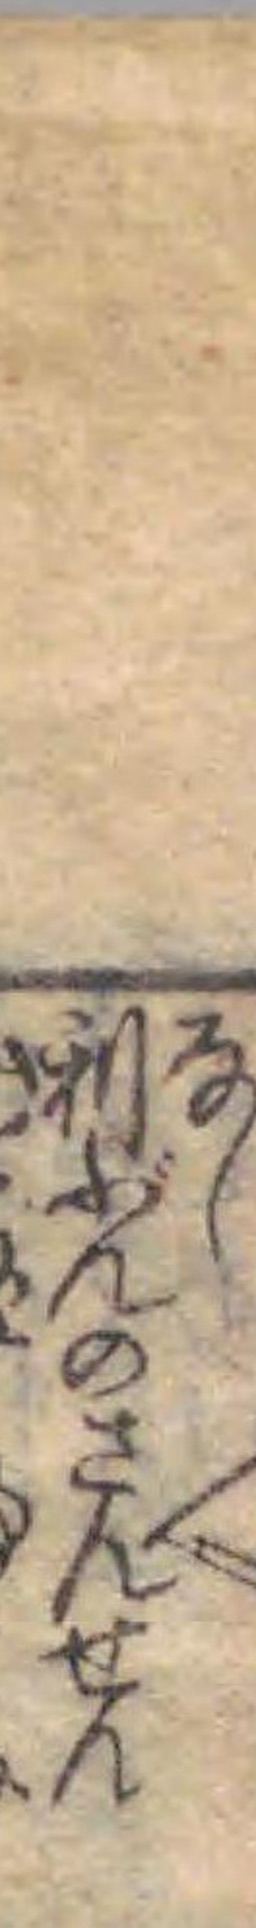利ぶんのさんせん
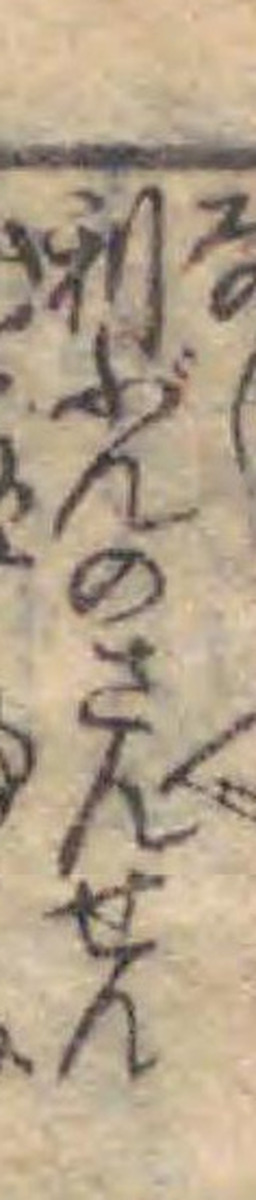利ぶんのさんせん
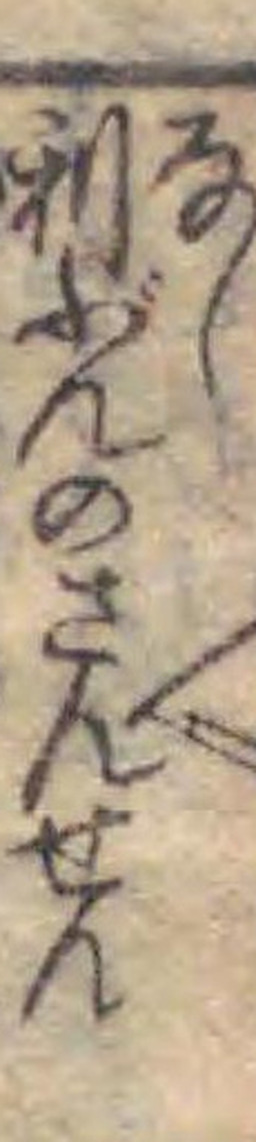利ぶんのさんせん
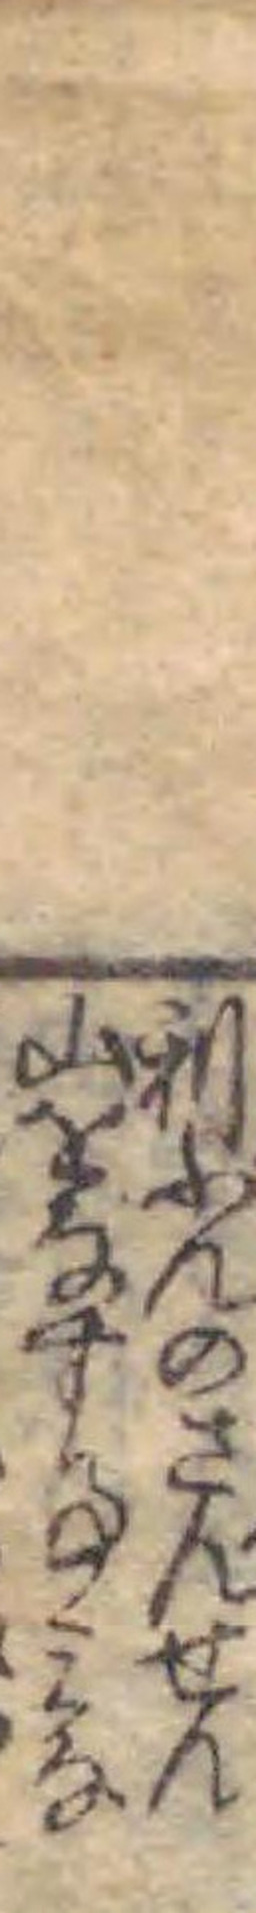山をなす事みな
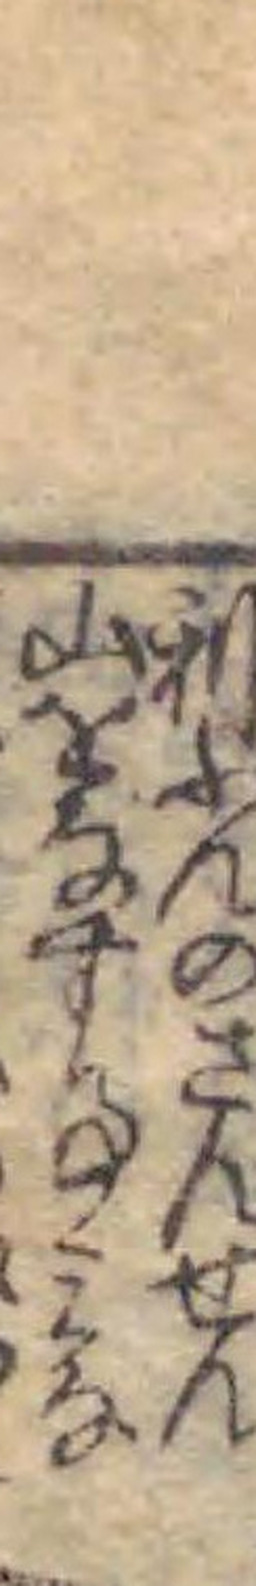山をなす事みな
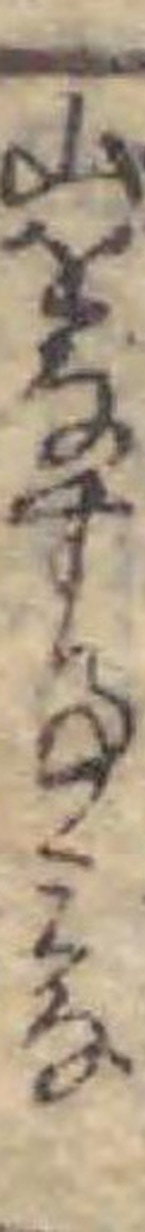山をなす事みな
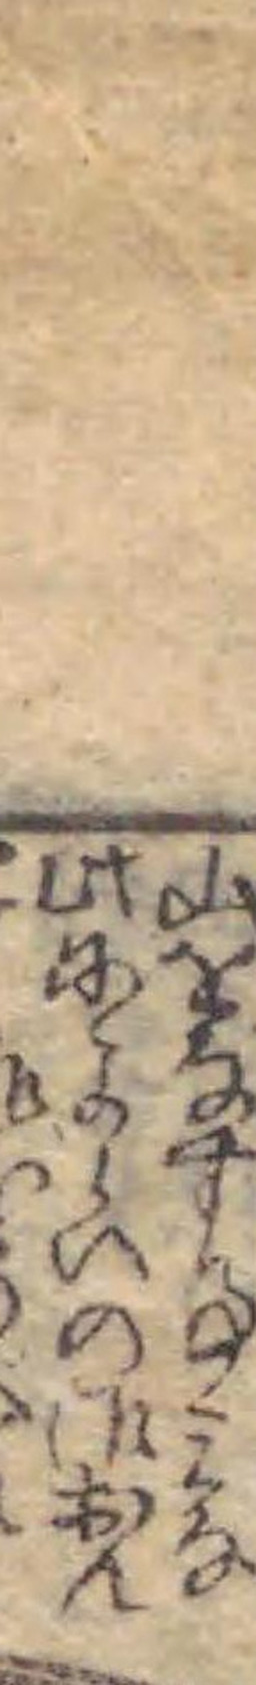此によらいの御おん
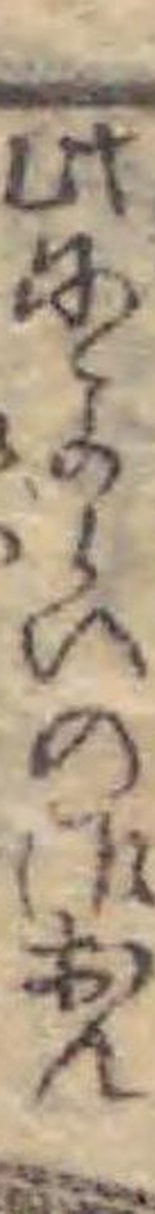此によらいの御おん
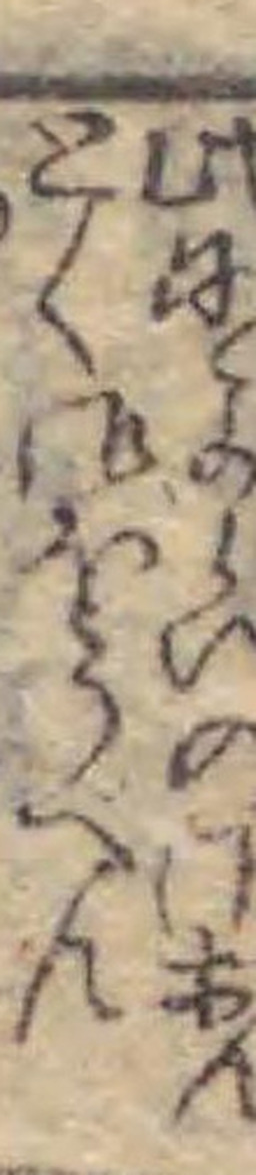とく御ほうべん
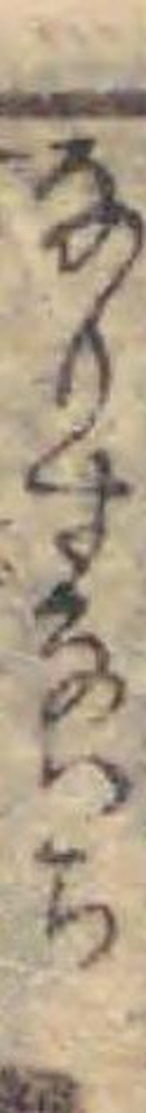なりすなはち
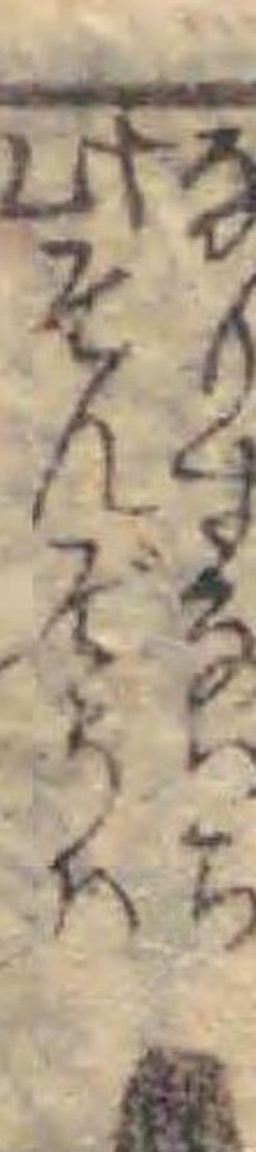此そんぞうは
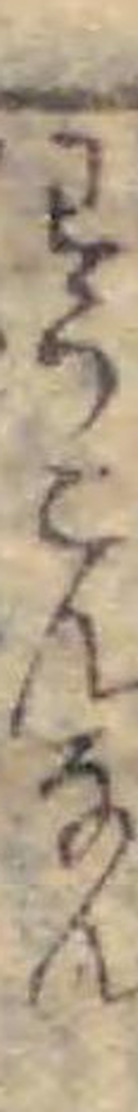わうこんなん
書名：身体開帳略縁起 : 3巻
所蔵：国立国会図書館 National Diet Library, JAPAN
